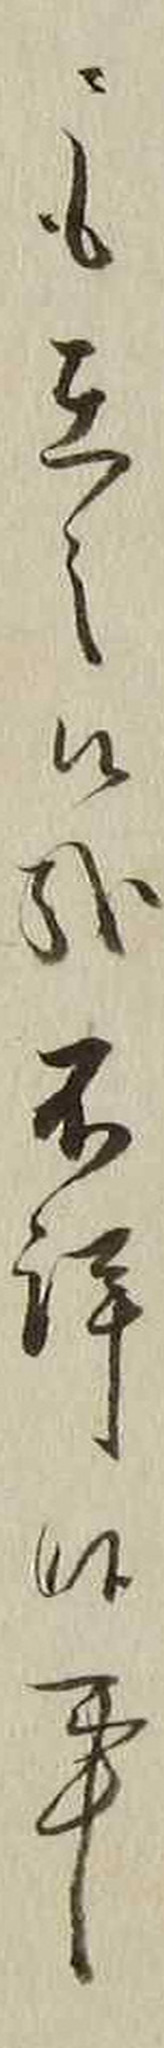ニも在之候哉不詳候事
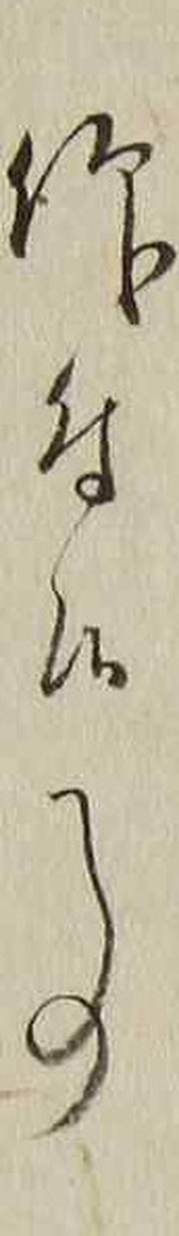仰付候事
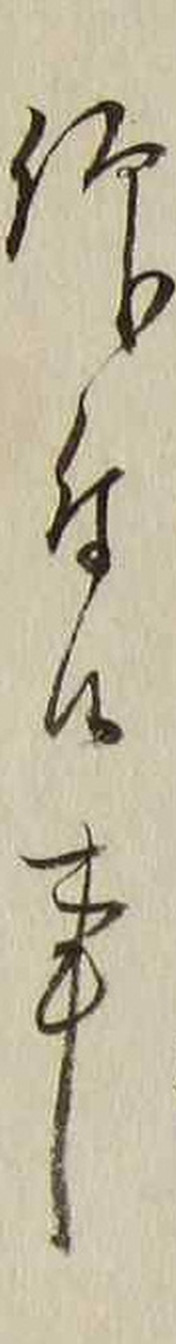仰付候事
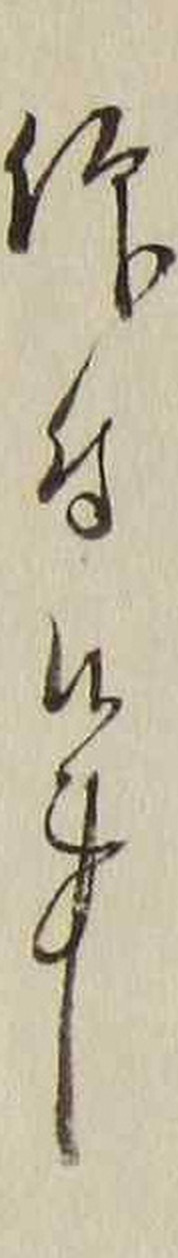仰付候事

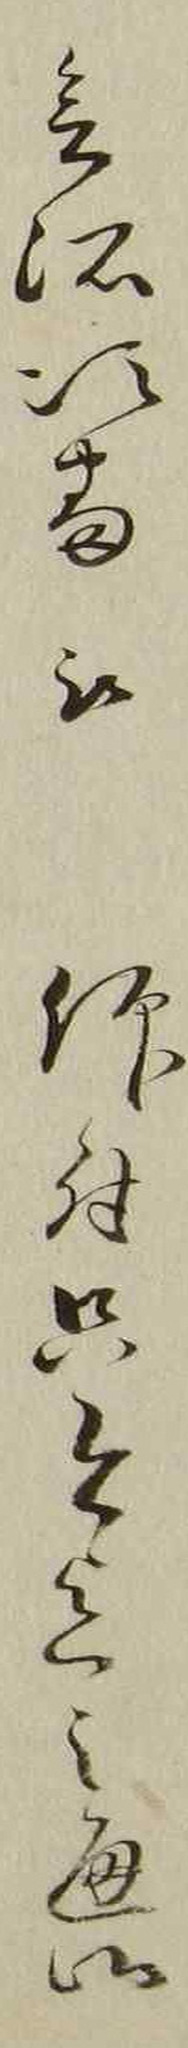会所次番被仰付只今迄之通御
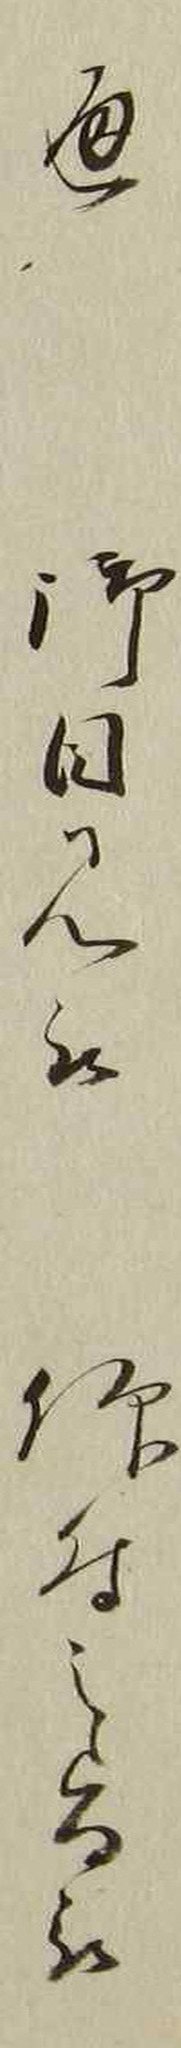通御目見被仰付之旨被
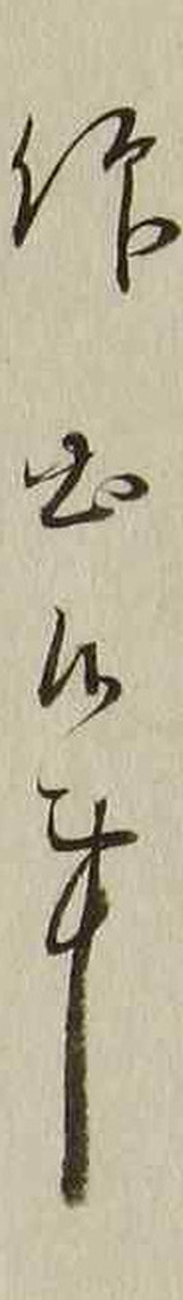仰出候事
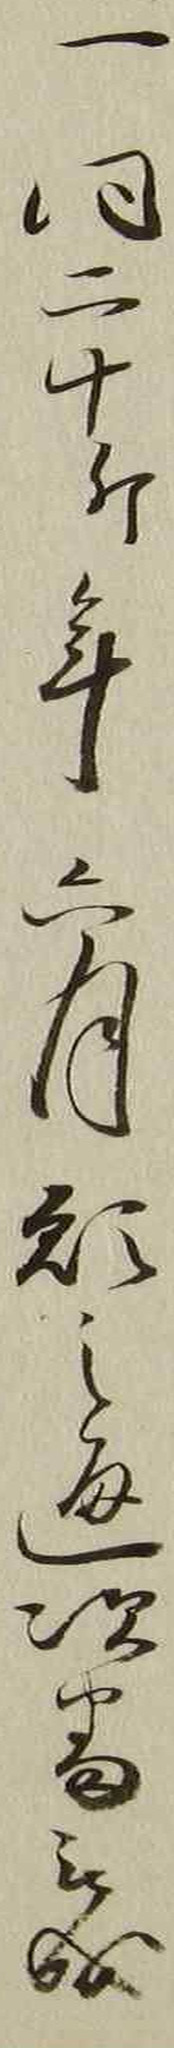一同二十卯年六月願之通次番被成
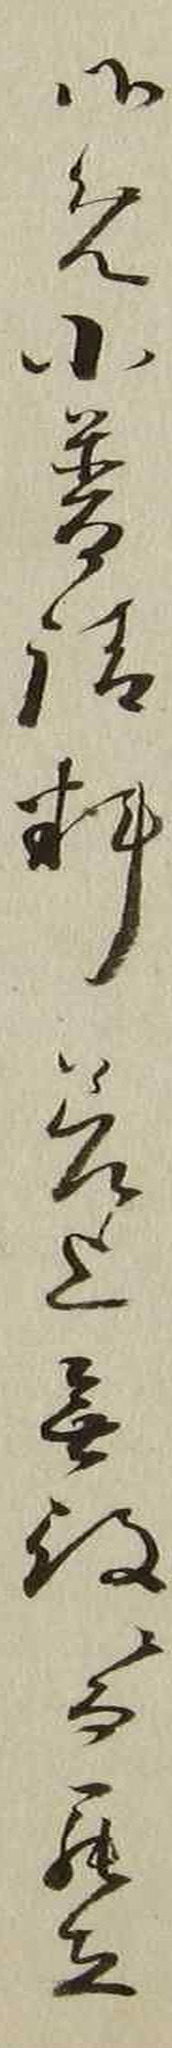御免小普請料差上無役ニ而罷立
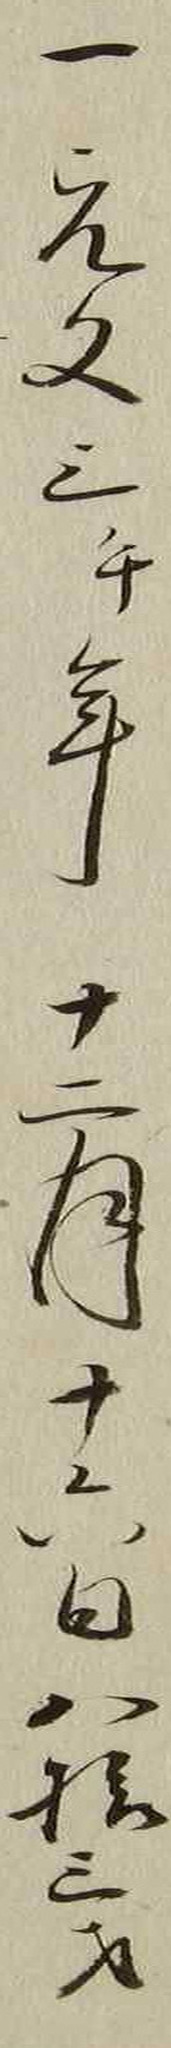一元文三午年十二月十六日八拾三才
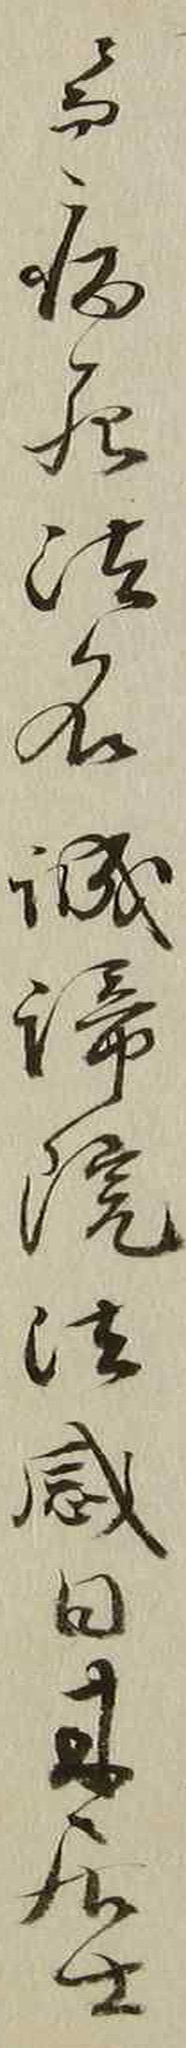ニ而病死法名誠諦院法感日求居士
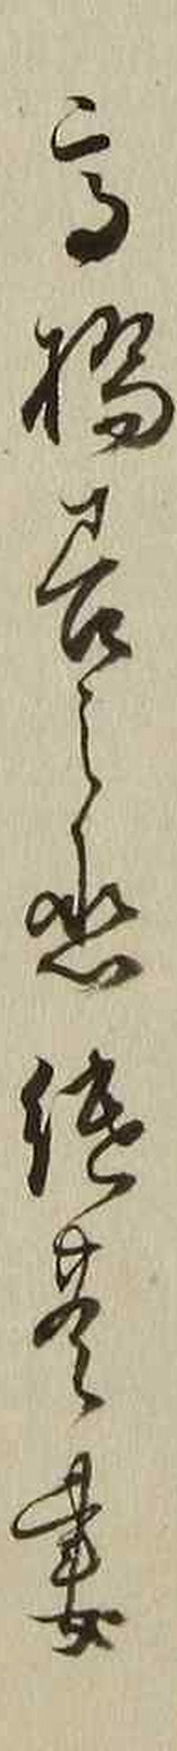女高橋善之丞継豊妻
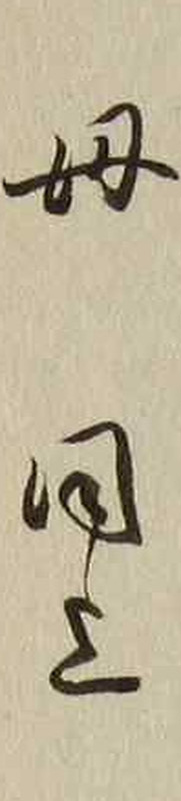母同上
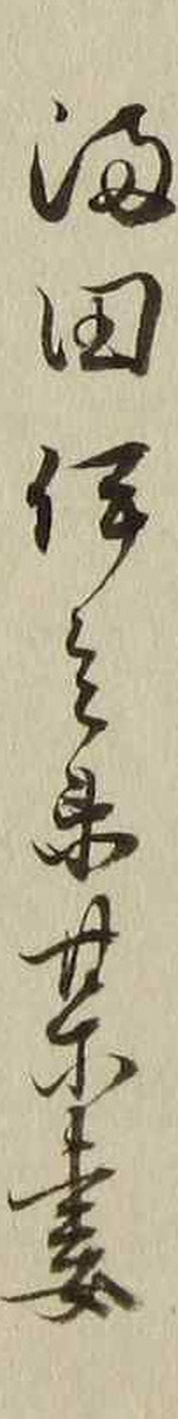女満田伊兵衛某妻
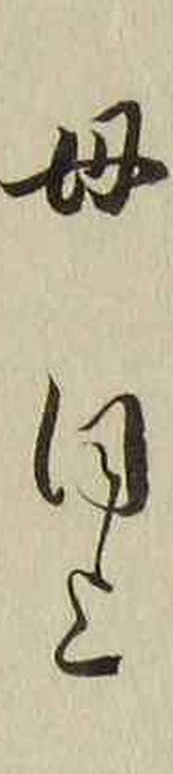母同上

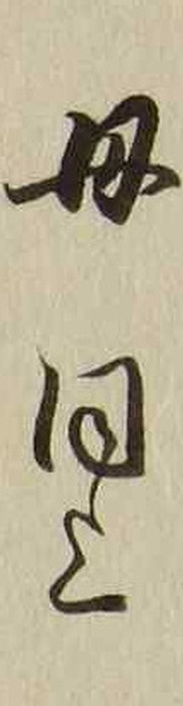母同上
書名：諸士系譜　巻之52　に之部3
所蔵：会津若松市立会津図書館
